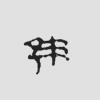隹
